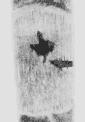十一
